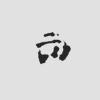可
